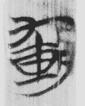軍
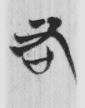右
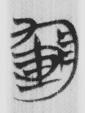軍
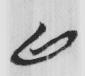㠯（以）
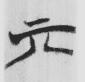亓
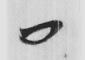厶
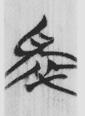卒B
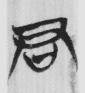君
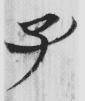子
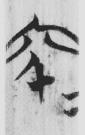{六千}=
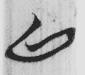㠯（以）
